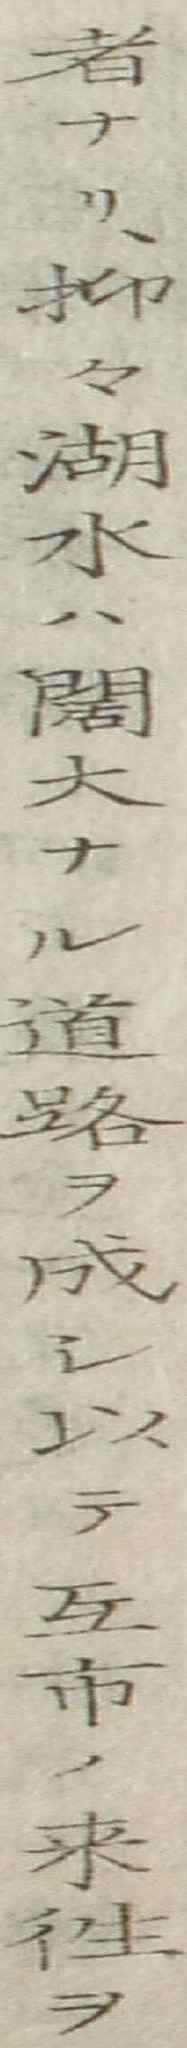者ナリ、抑々湖水ハ闊大ナル道路ヲ成シ以テ互市ノ来往ヲ
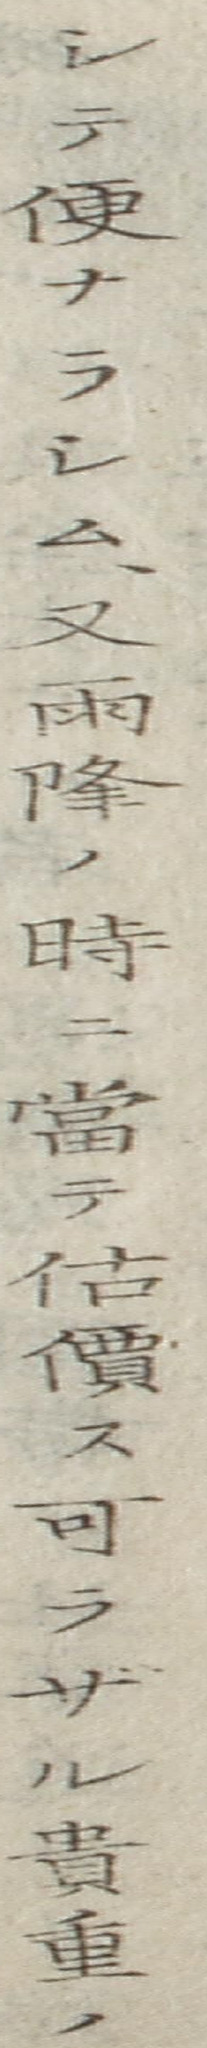シテ便ナラム、又雨降ノ時ニ当テ估価ス可ラザル貴重ノ
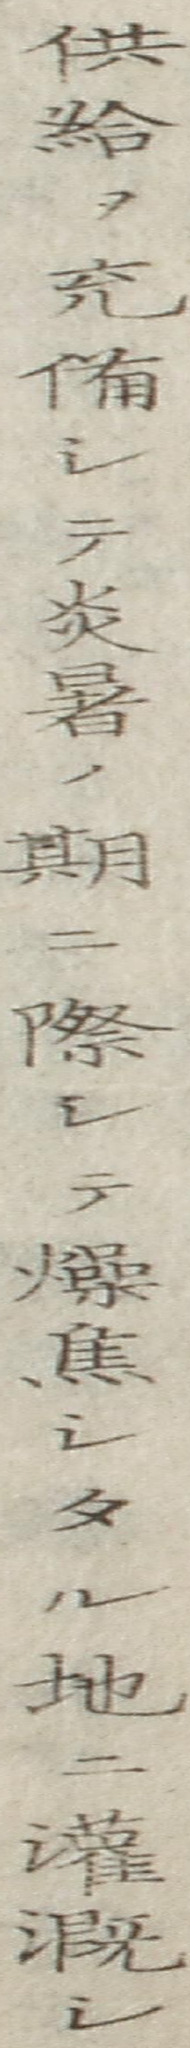供給ヲ充備シテ炎暑ノ期ニ際シテ燥焦シタル地ニ灌漑シ
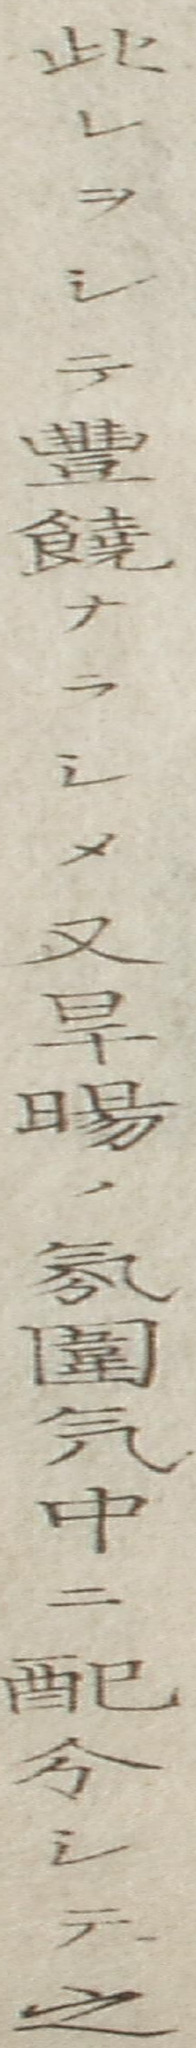此レヲシテ豊饒ナラシメ又早晹ノ雰囲気中ニ配分シテ之
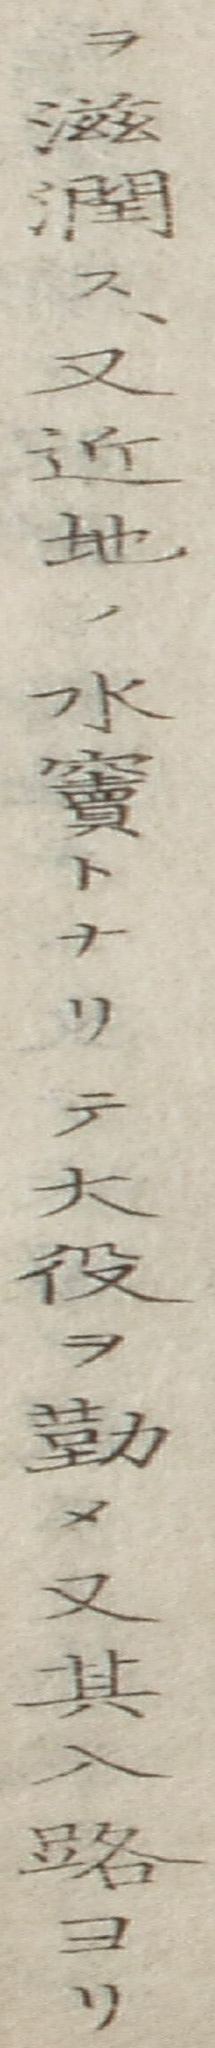ヲ滋潤ス、又近地ノ水竇トナリテ大役ヲ勤メ又其入路ヨリ

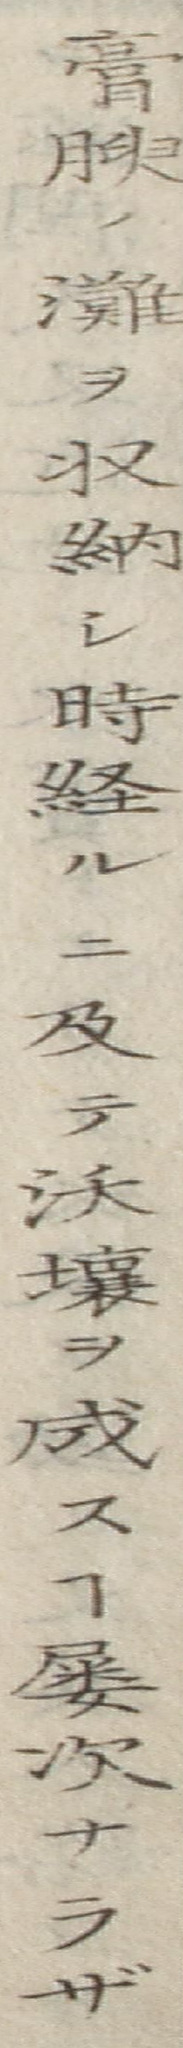膏腴ノ灘ヲ収納シ時経ルニ及テ沃壌ヲ成スヿ屡次ナラザ
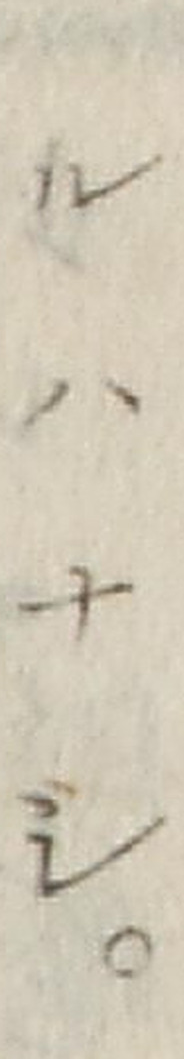ルハナシ。
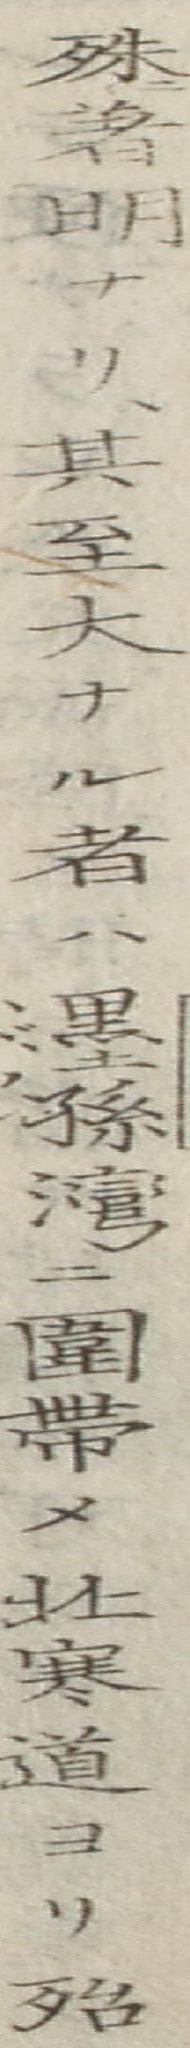殊ニ著明ナリ、其至大ナル者ハ墨孫湾ニ囲帯メ北寒道ヨリ殆
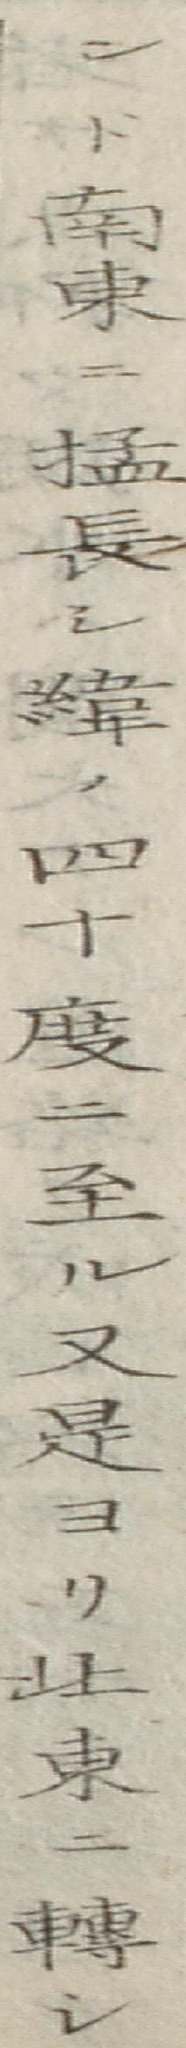ンド南東ニ掹長シ緯ノ四十度ニ至ル又是ヨリ北東ニ伝シ
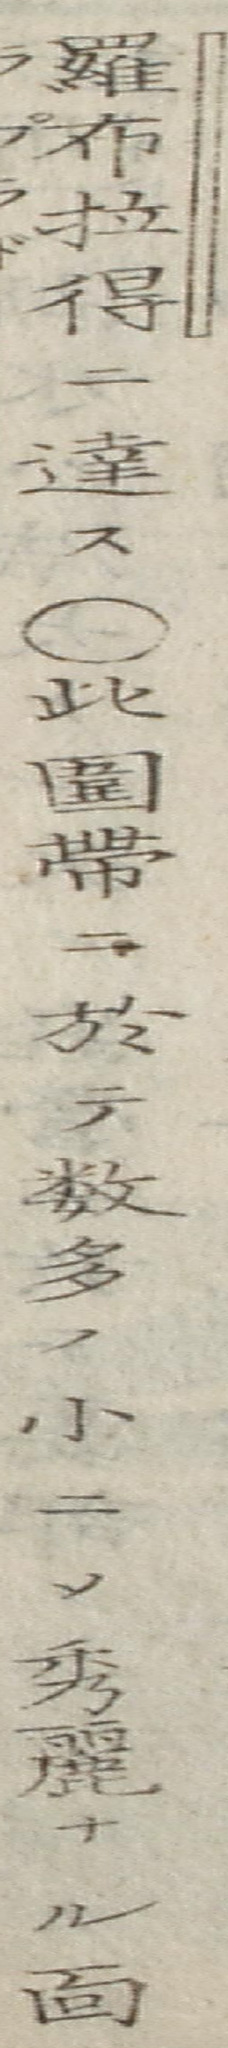羅布拉得ニ達ス○此囲帯ニ於テ数多ノ小ニシテ秀麗ナル面
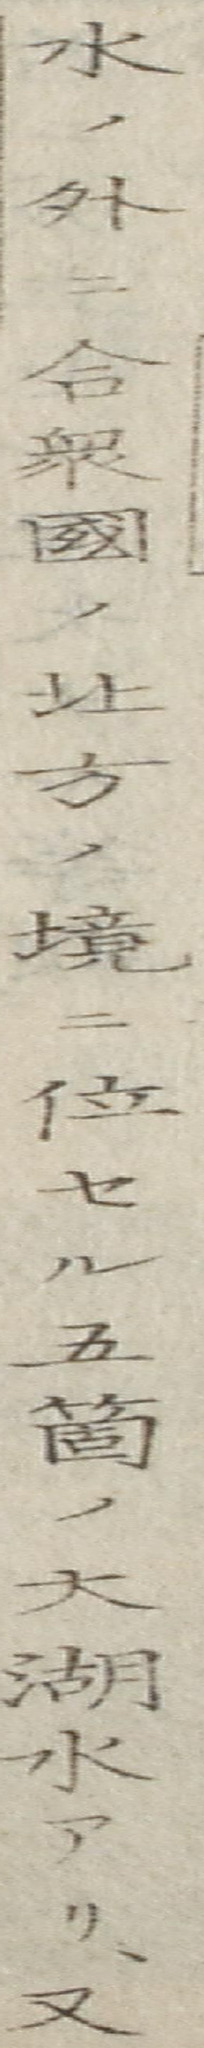水ノ外ニ合衆国ノ北方ノ境ニ位セル五箇ノ大湖水アリ、又
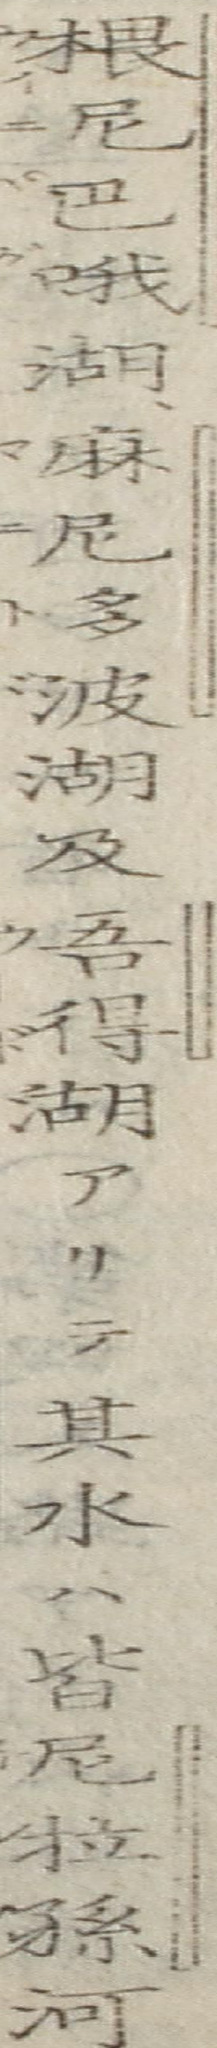椳尼巴哦湖、朝尼多波湖及吾得湖アリテ其水ハ皆尼拉孫河
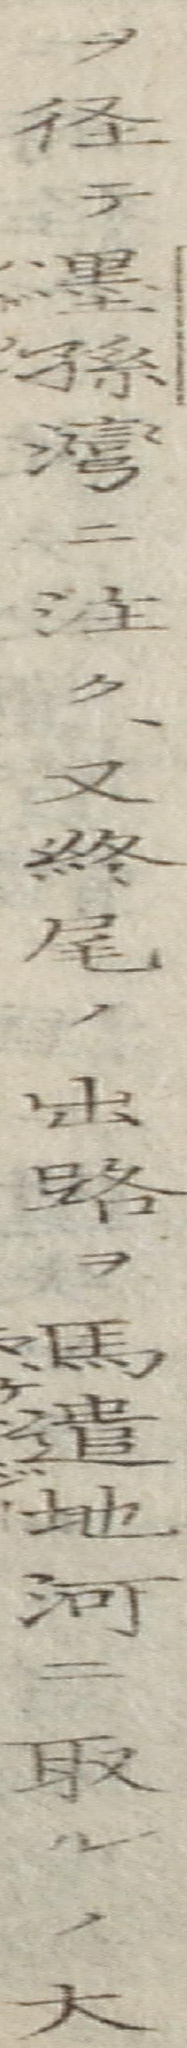ヲ径テ墨孫湾ニ注ク、又終尾ノ出路ヲ馬遣地河ニ取ルノ大
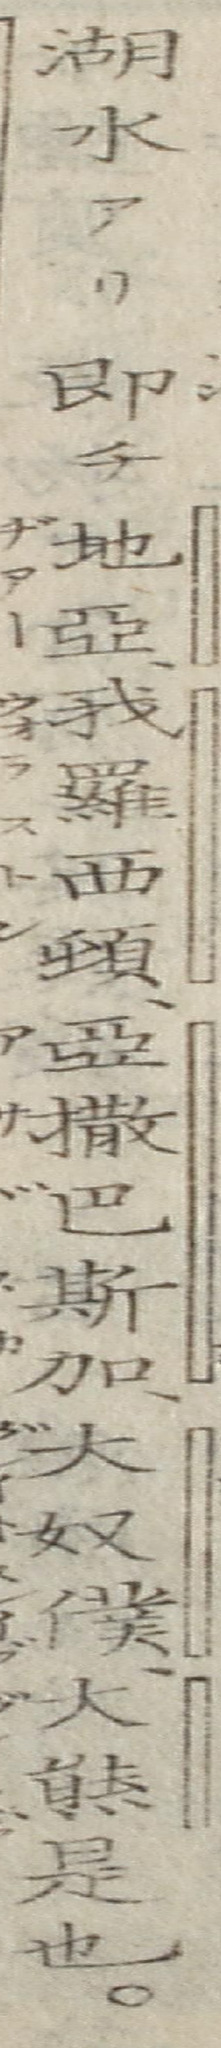湖水アリ即チ地亜、我羅西頓、亜撤巴斯加、大奴僕、大熊是也。
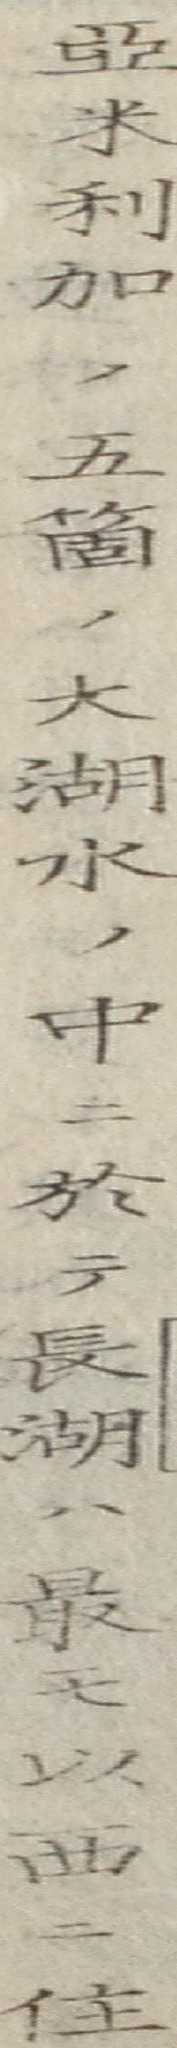亜米利加ノ五箇ノ大湖水ノ中ニ於テ長湖ハ最モ以西ニ住
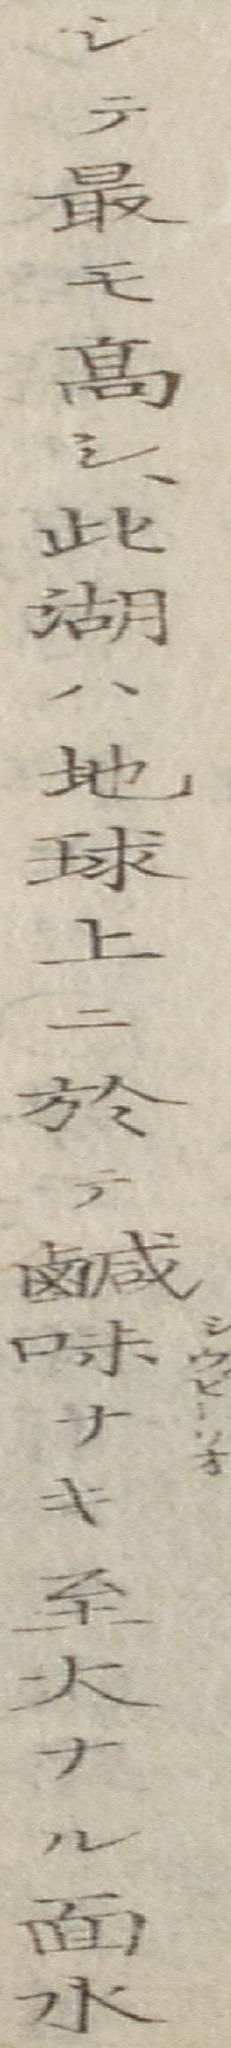シテ最モ高シ、此湖ハ地球上ニ於テ鹹味ナキ至大ナル面水
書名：地形論　巻二
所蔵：東京大学地震研究所図書室 Earthquake Research Institute Library, The University of Tokyo, JAPAN
